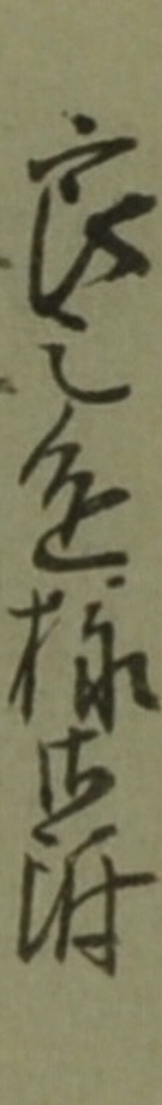良之進様御附
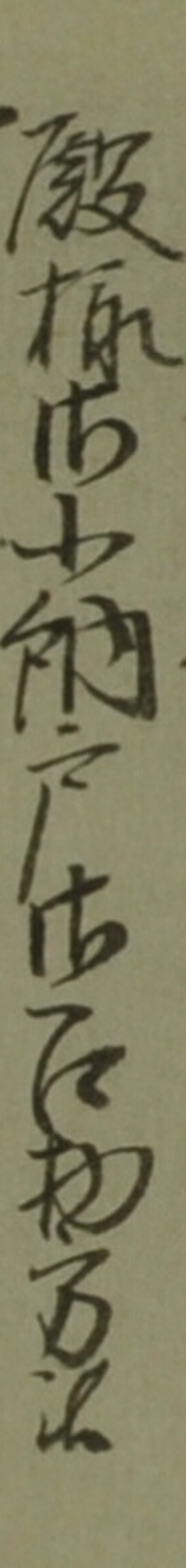殿様御小納戸御召物方被
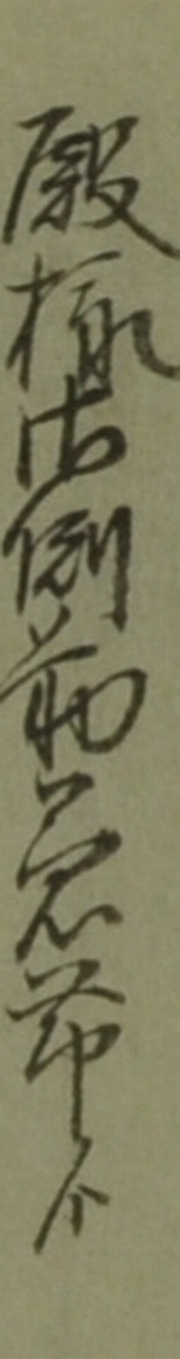殿様御側勤兼帯ゟ
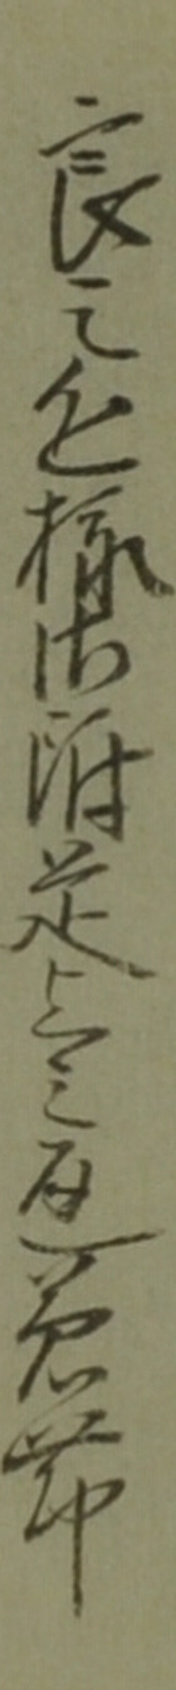良之進様御附是迄之通兼帯
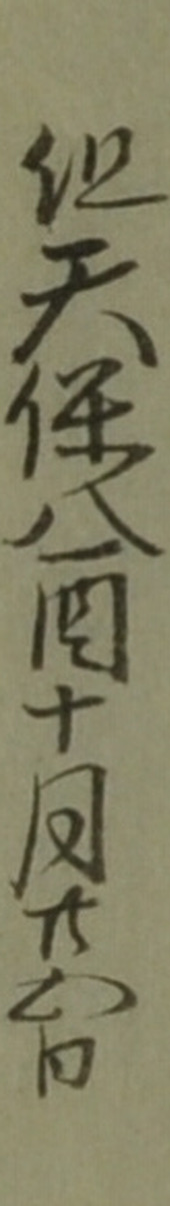但天保八酉十月廿五日
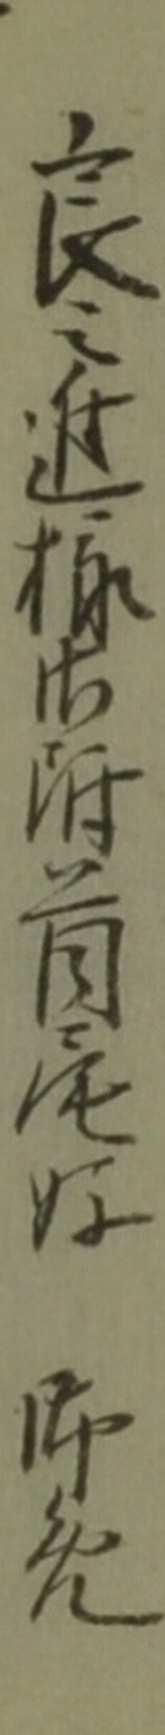良之進様御附首尾好御免
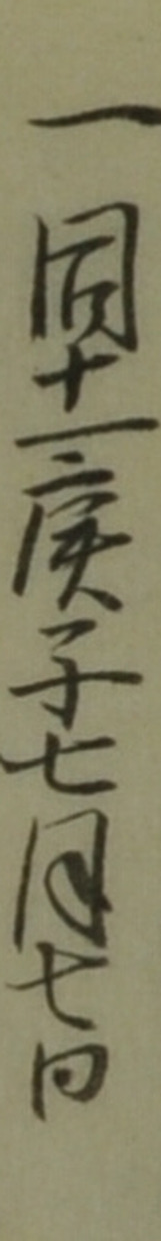一同十一庚子七月七日
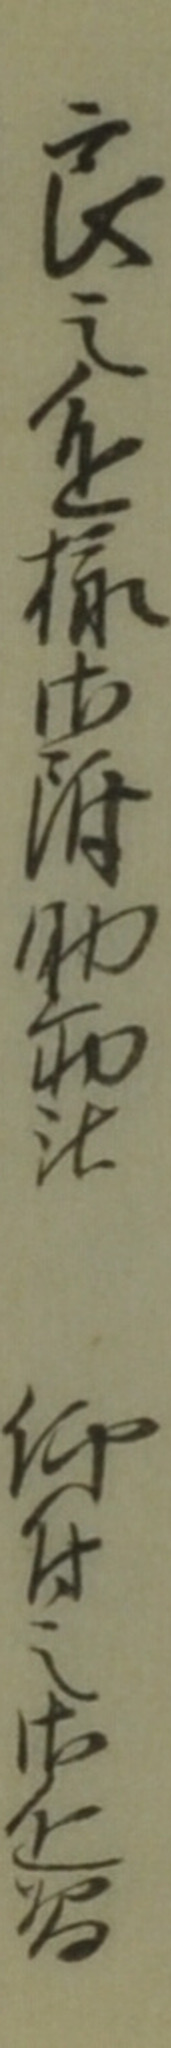良之進様御附助勤被仰付之御近習
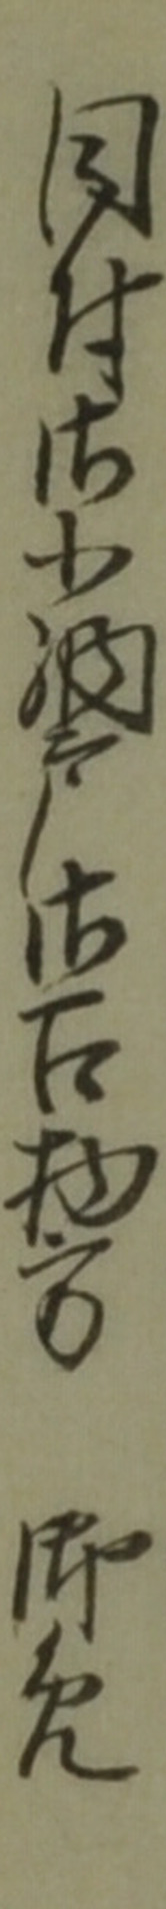目付御小納戸御召物方御免
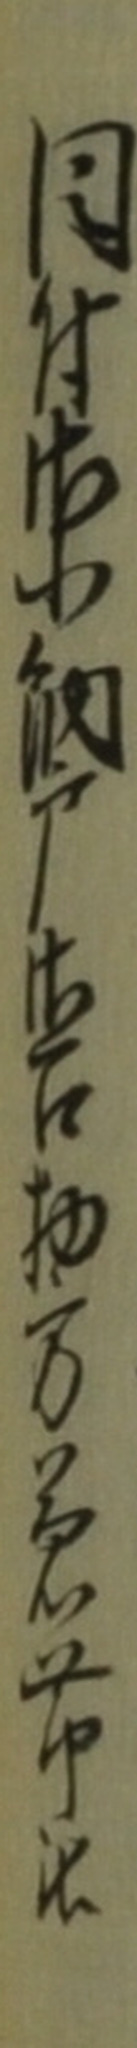目付御小納戸御召物方御免
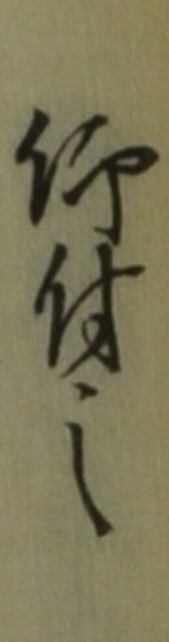仰付之
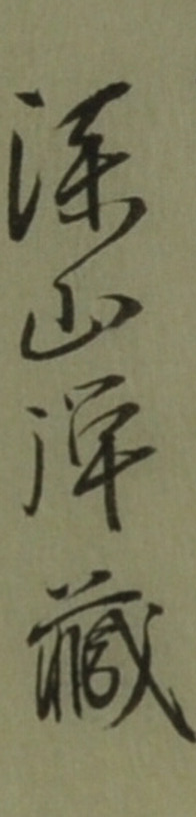深山弾蔵
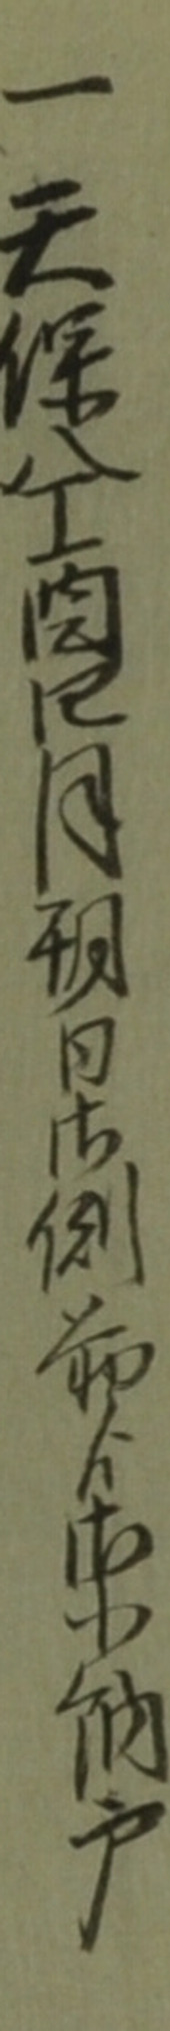一天保八丁酉四月朔日御側勤ゟ御小納戸
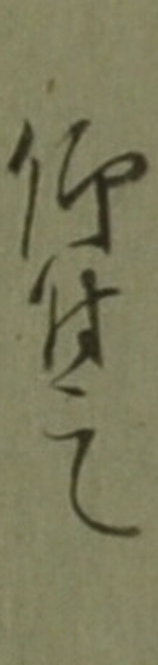仰付之

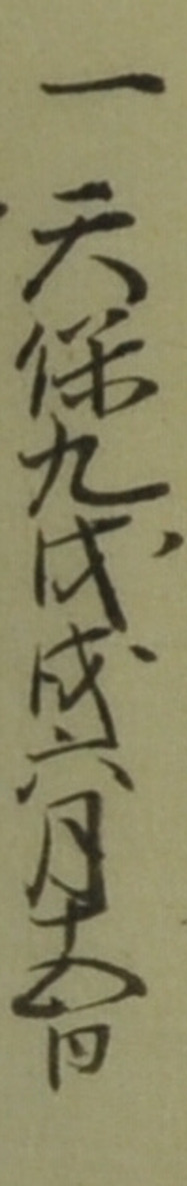一天保九戊戌六月十五日
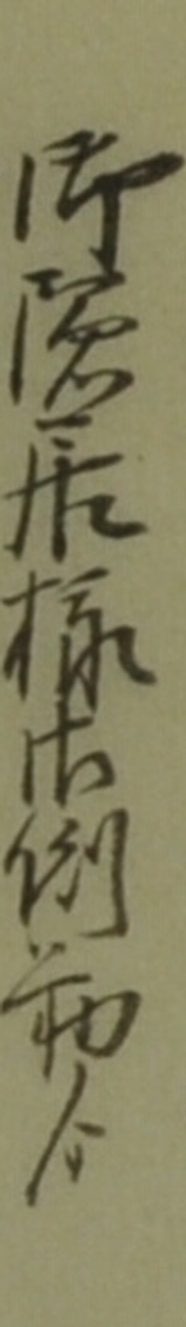御隠居様御側勤ゟ
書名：諸御役代々録（四）
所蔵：伊那市立高遠町図書館・合同会社AMANE
